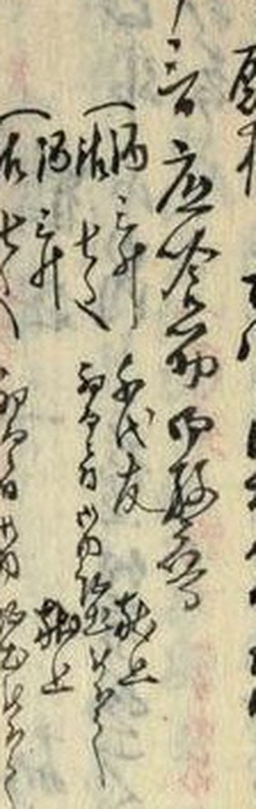酒三升千代友献上
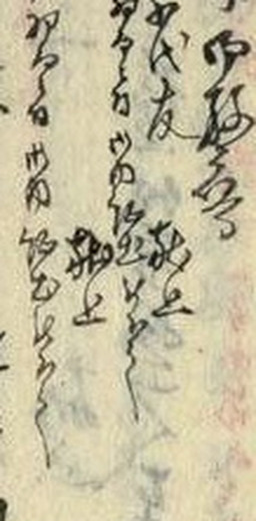御内証出被下之
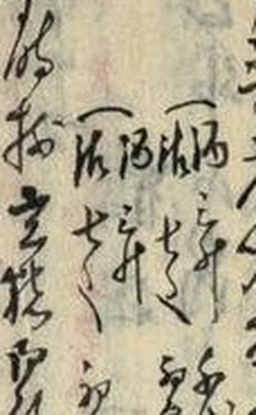酒三升
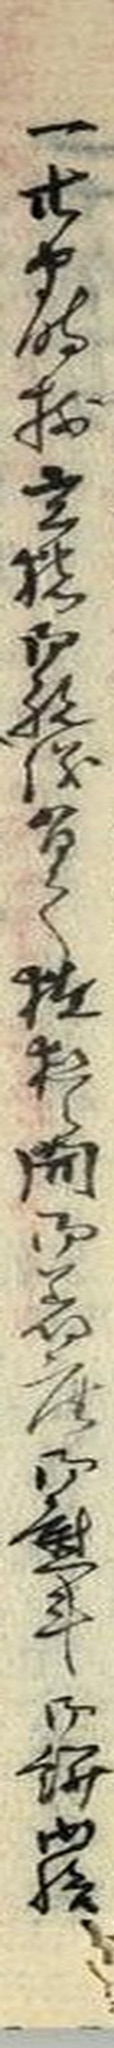一七半時揃玄猪御祝儀有之韃靼之間御着座御熨斗御餅御膳
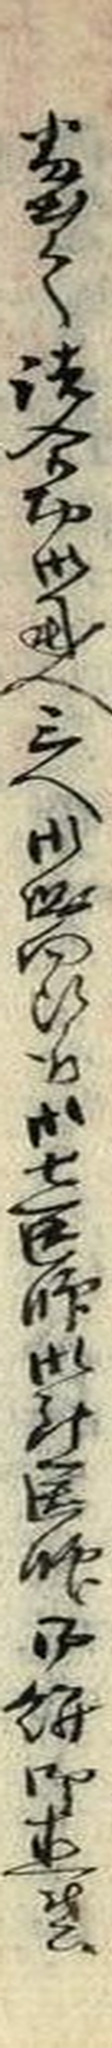番出之詰合切御用人三人御側向頭取御匙医師御針医師御餅御直被下
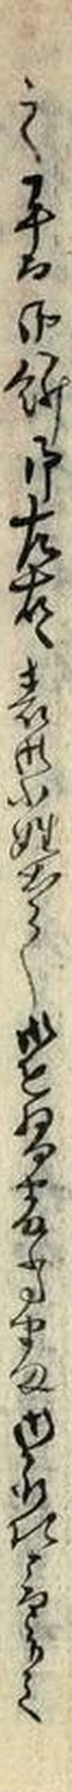之畢而御餅御左右へ表御小姓出之御近習番当番御取次ニ而被下之
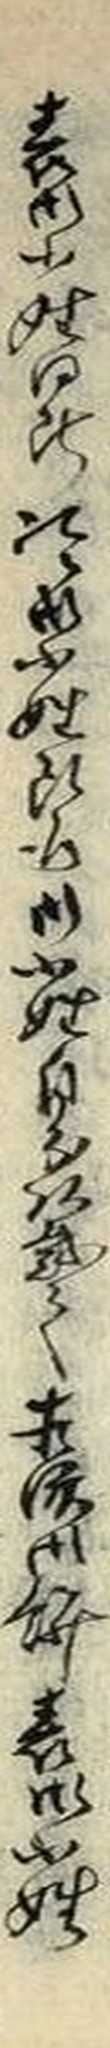表御小姓同断次ニ御小姓頭取御小姓自分頂戴之相済御餅表御小姓
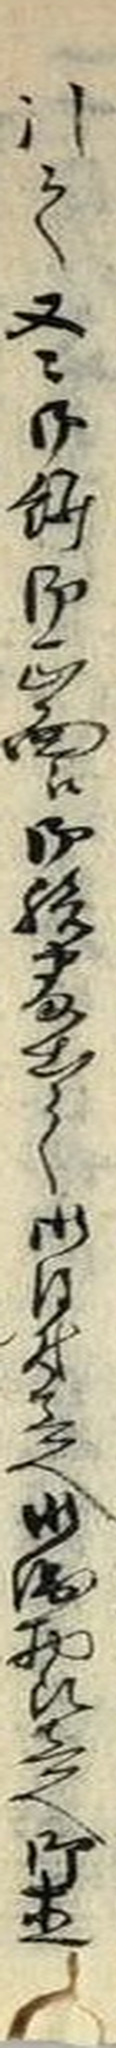引之又々御餅御正面江御膳番出之御目付壱人御側物頭壱人御直
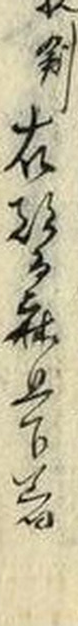右都而麻上下着
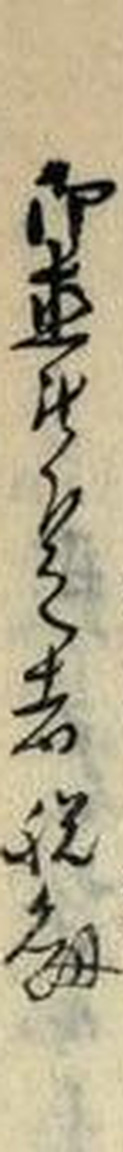御直被下之者脱剣
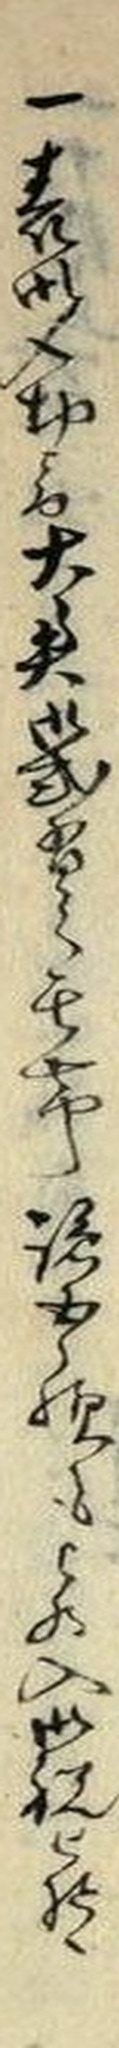一表御〆切ニ而大奥御式有之其節謙五郎様ニも被為入御祝被遊候

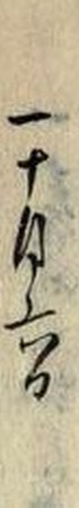一十月六日
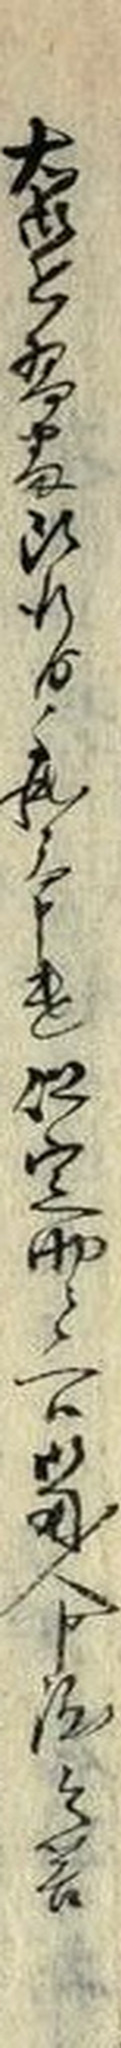右御近習番頭取ゟ手紙ニ而申遣但定助ニ候ヘハ御用人申渡之筈
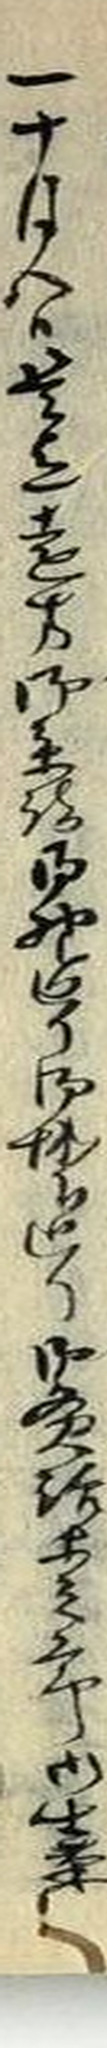一十月八日是迄遠方御参詣御野廻り御城下廻り御灸治等之節御生菓
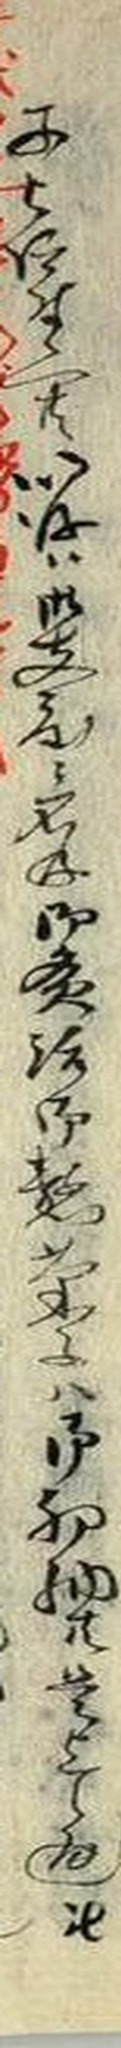子被仰付候へ共以後ハ御支度ニ不及御灸治御熬菓子ハ御初納共是迄之通被
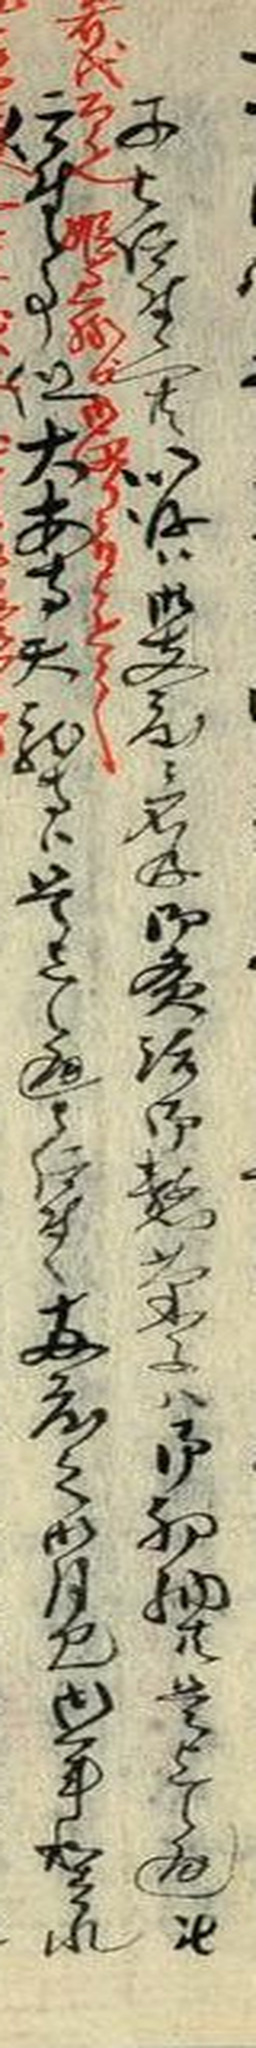仰付候事但大安寺天龍寺ハ是迄之通被仰付候両度之御月見御年わすれ
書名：少傅日録抄（斉承付側向頭取日記、在国）
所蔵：福井県文書館 Fukui Prefectural Archives
